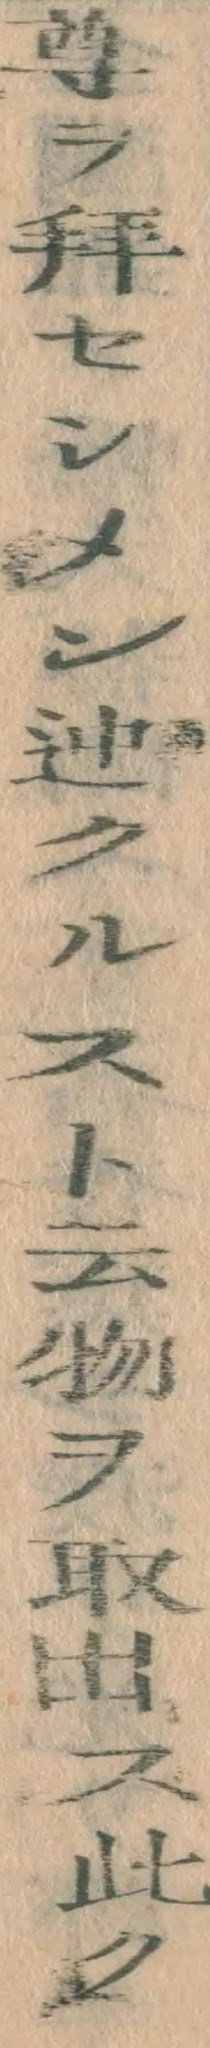尊ヲ拝セシメン迚クルスト云物ヲ取出ス此ク
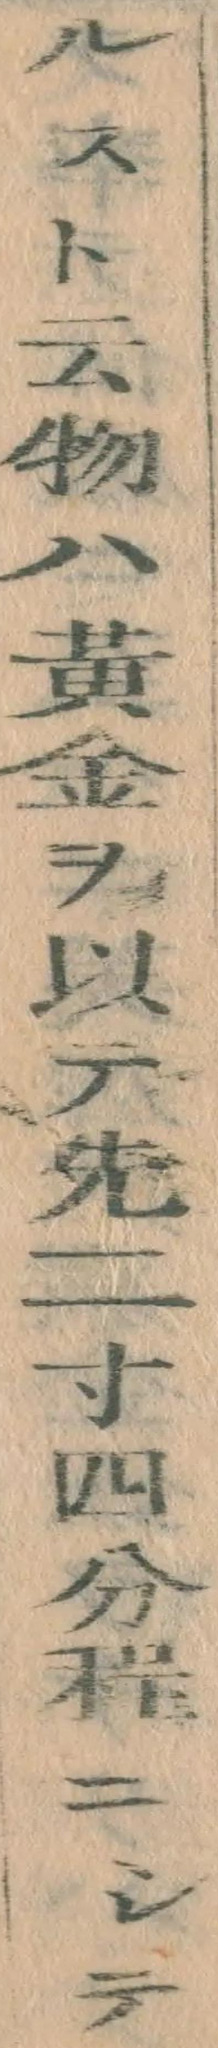ルスト云物ハ黄金ヲ以テ先二寸四分程ニシテ
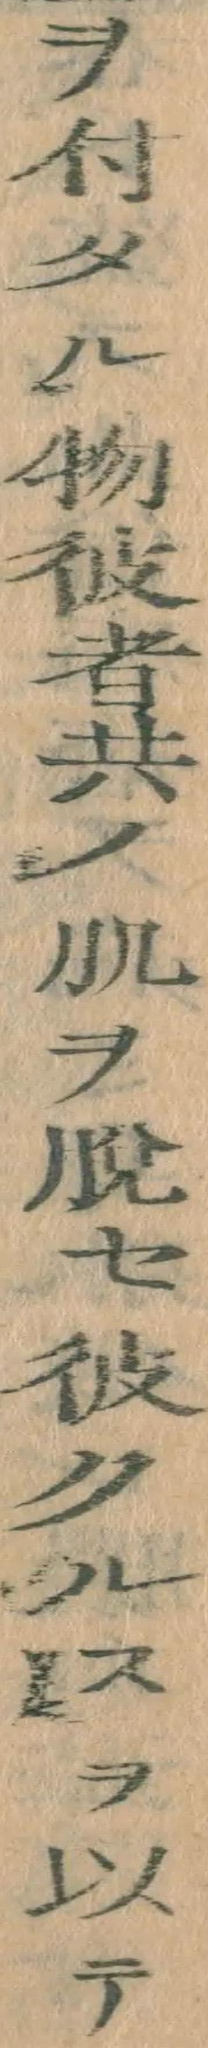ヲ付タル物彼者共ノ肌ヲ脱セ彼クルスヲ以テ
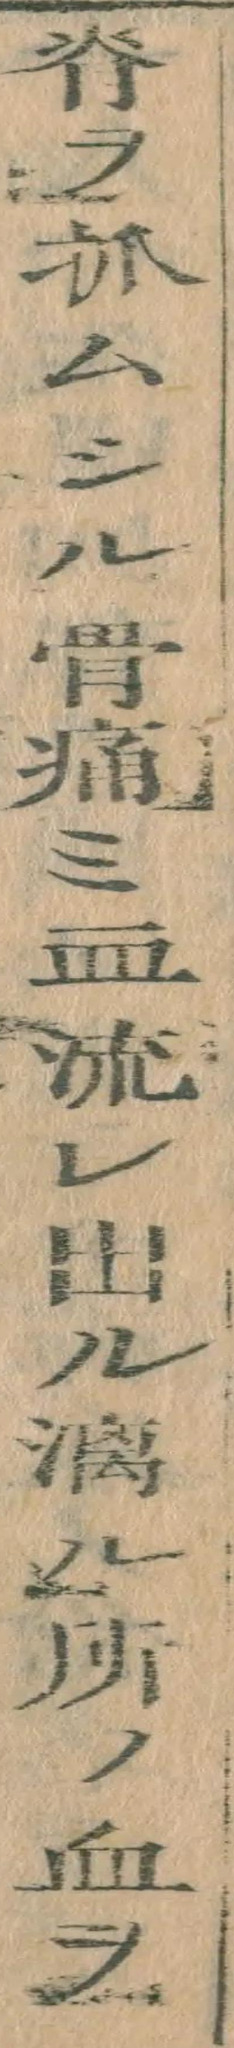背ヲ抓ムシル骨痛ミ血流レ出ル漓ル所ノ血ヲ
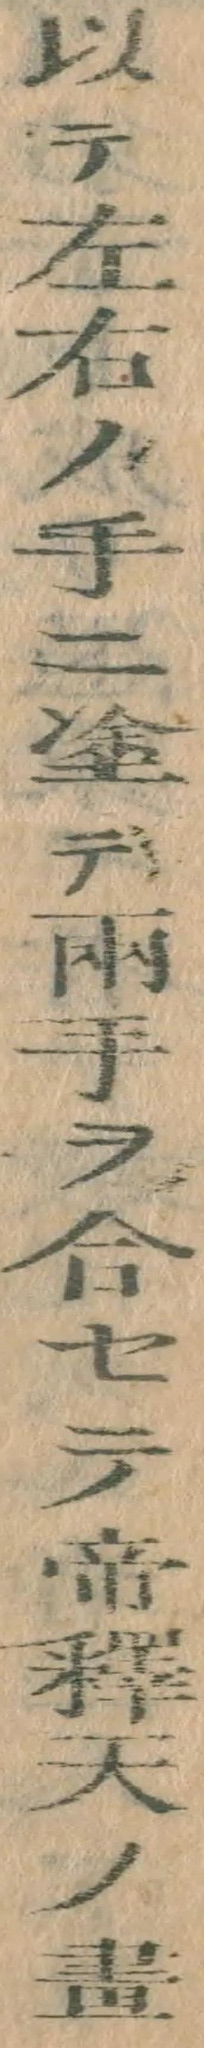以テ左右ノ手ニ塗テ両手ヲ合セテ帝釈天ノ画
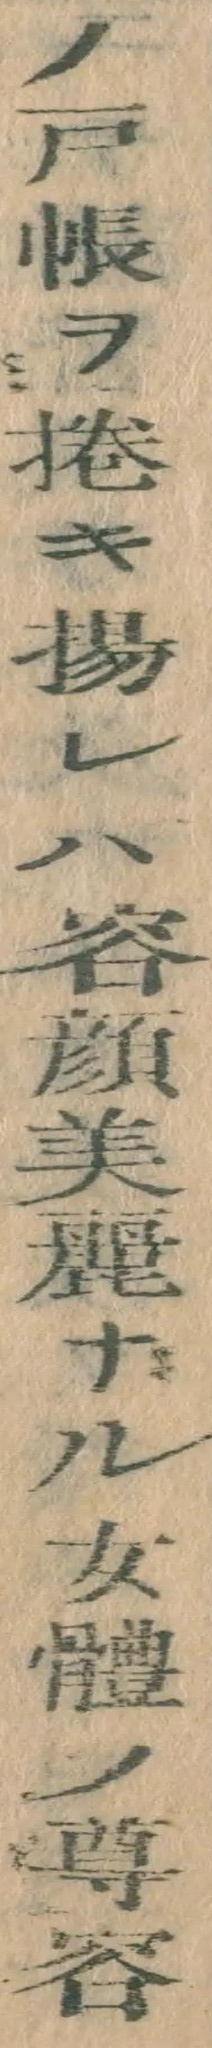ノ戸張ヲ捲キ揚レハ容顔美麗ナル女体ノ尊容
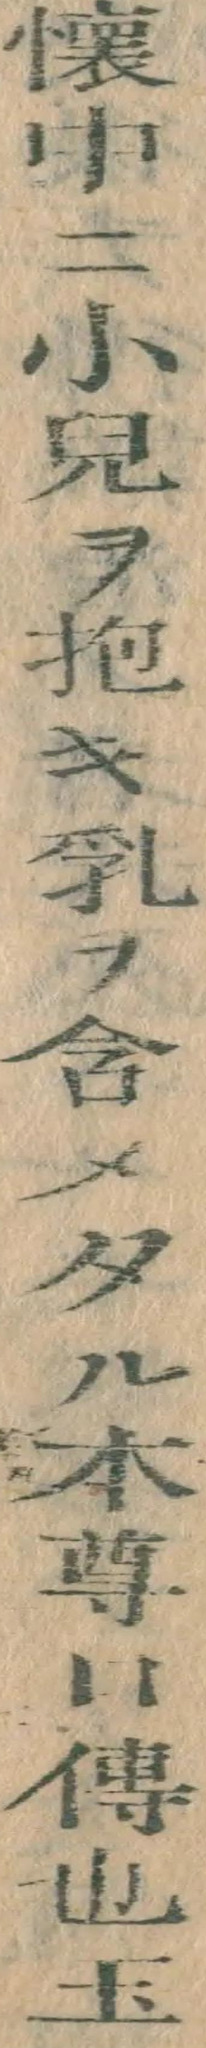懐中ニ小児ヲ抱キ乳ヲ含メタル本尊口伝也玉
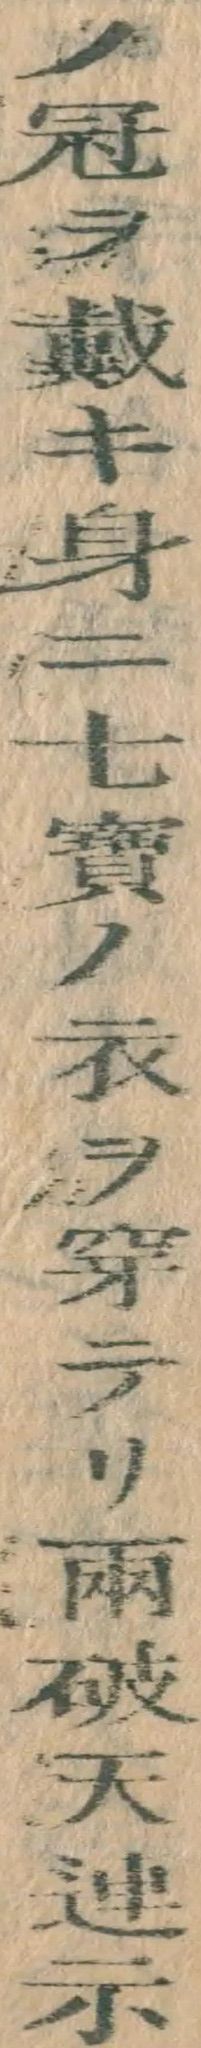ノ冠ヲ戴キ身ニ七宝ノ衣ヲ穿テリ両破天連示
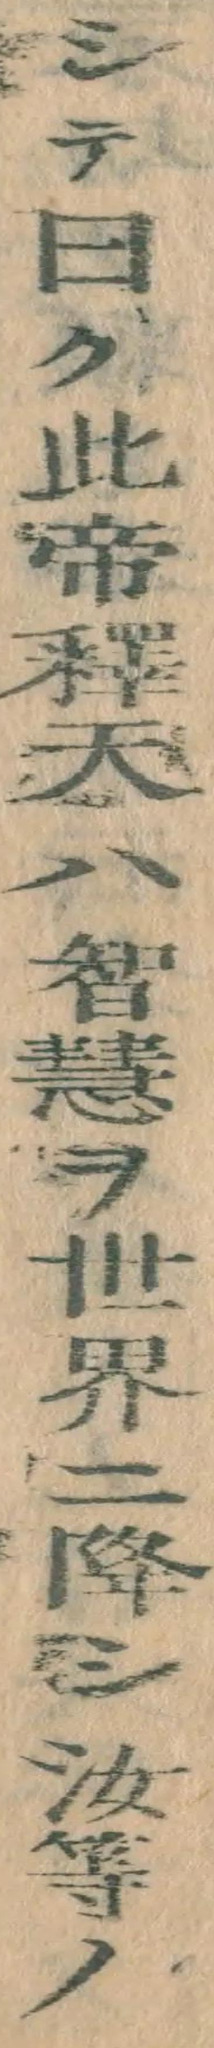シテ曰ク此帝釈天ハ智慧ヲ世界ニ降シ汝等ノ
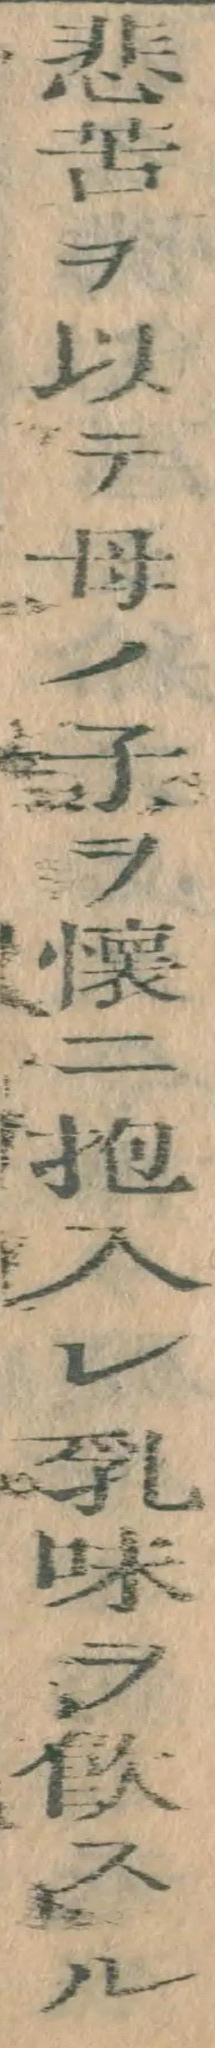悲苦ヲ以テ母ノ子ヲ懐ニ抱入レ乳味ヲ飲スル

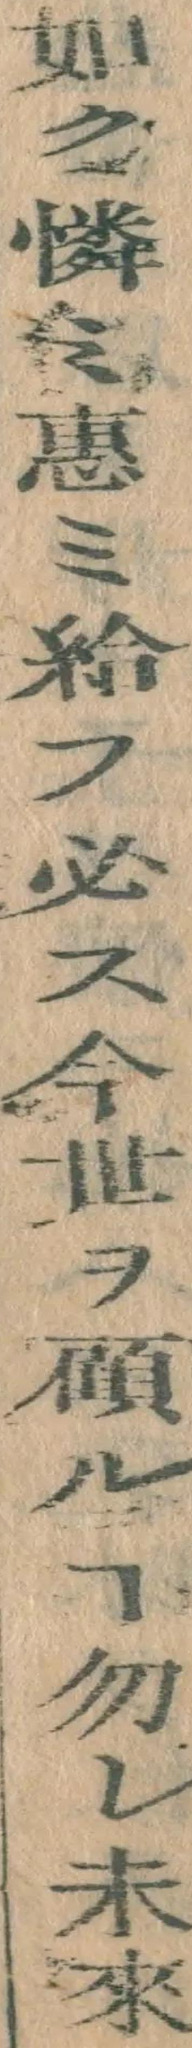如ク憐ミ恵ミ給フ必ス今世ヲ顧ルヿ勿レ未来
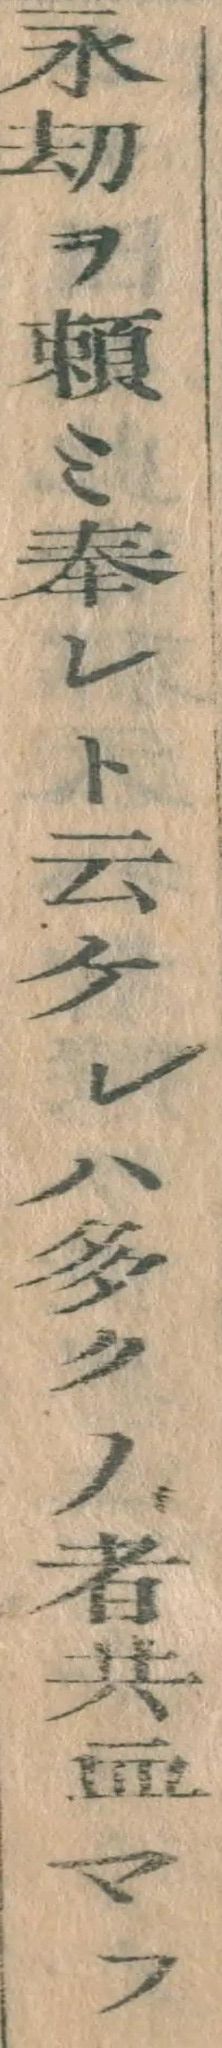永劫ヲ頼ミ奉レト云ケレハ多クノ者共血マフ
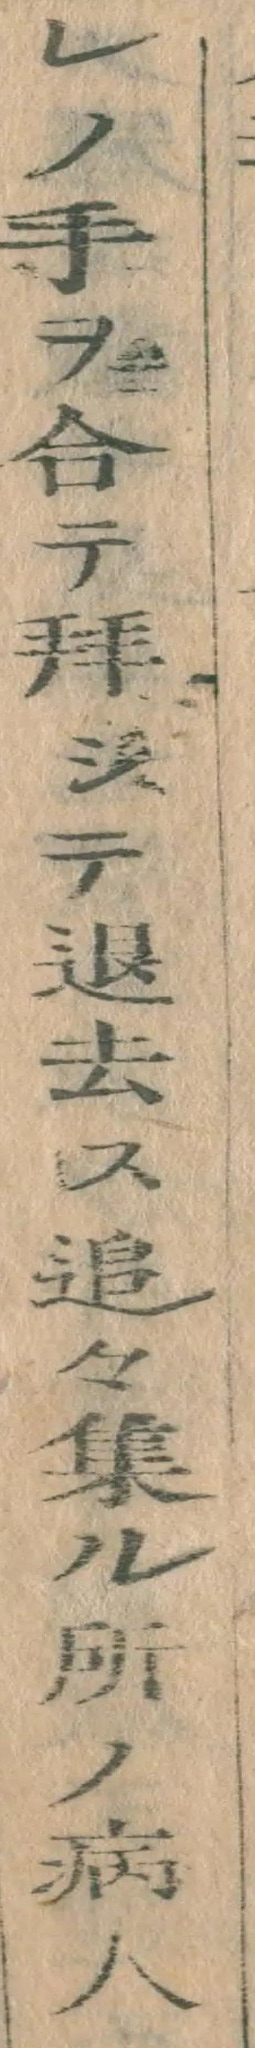レノ手ヲ合テ拝シテ退去ス追々集ル所ノ病人
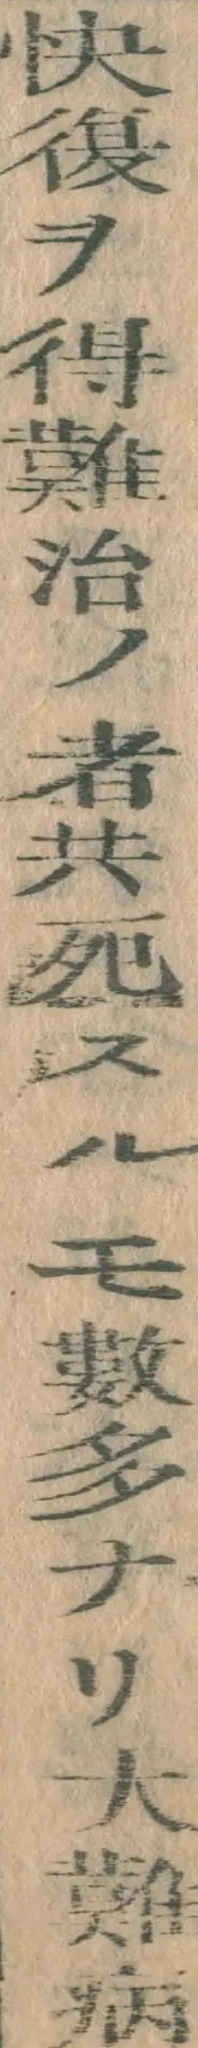快復ヲ得難治ノ者共死スルモ数多ナリ大難病
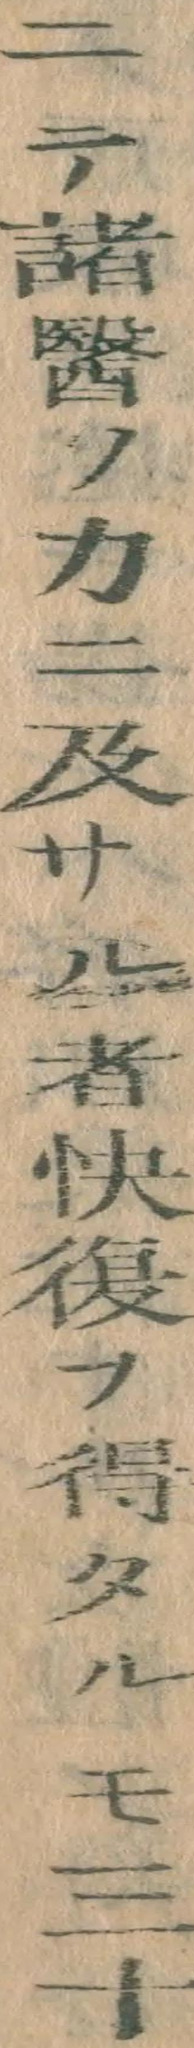ニテ諸医ノ力ニ及サル者快復ヲ得タルモ三十
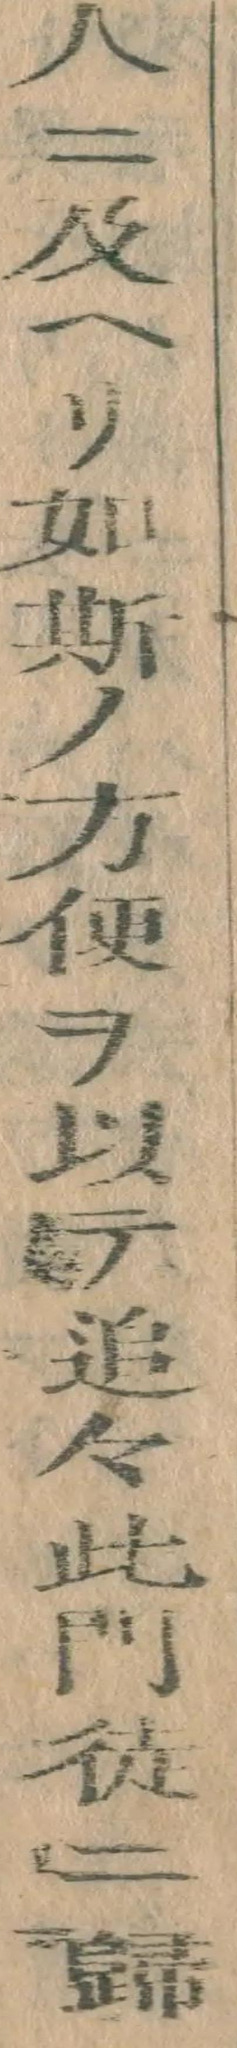人ニ及ヘリ如斯ノ方便ヲ以テ追々此門徒ニ帰
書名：南蛮寺興廃記
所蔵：国立国会図書館 National Diet Library, JAPAN
